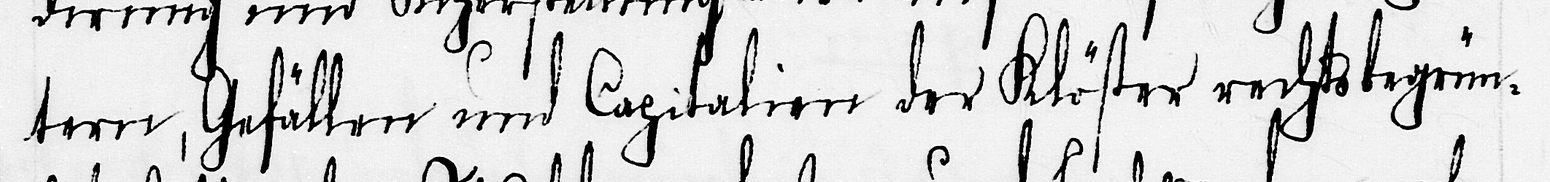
tern, Gefällen und Capitalien der Klöster rechtsbegrün¬
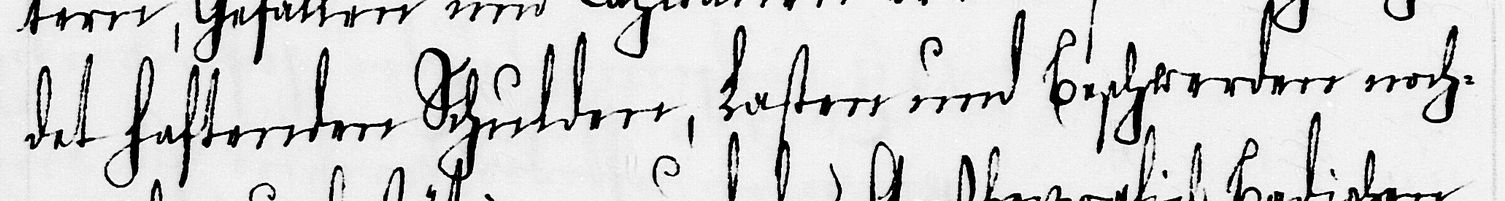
det haftenden Schulden, Lasten und Beschwerden noch¬
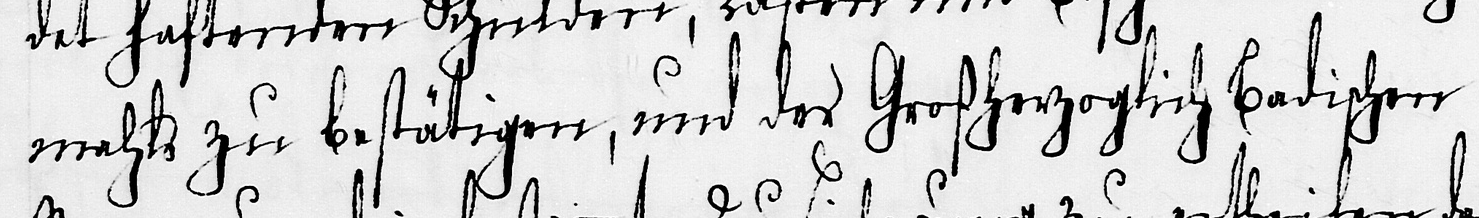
mahls zu bestätigen, und der Großherzoglich Badischen
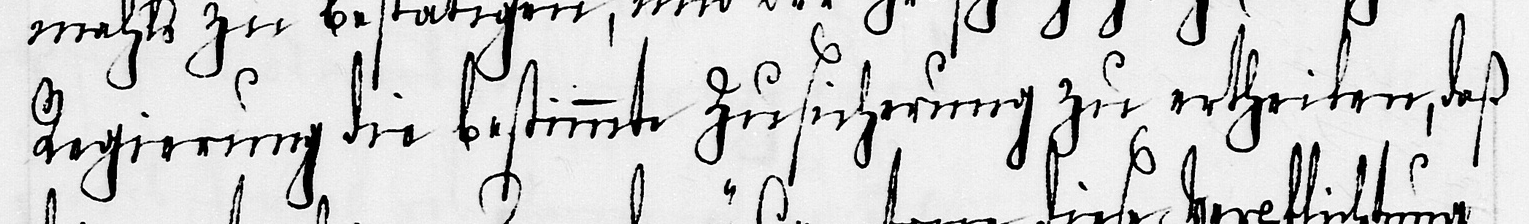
Regierung die bestimmte Zusicherung zu ertheilen, daß
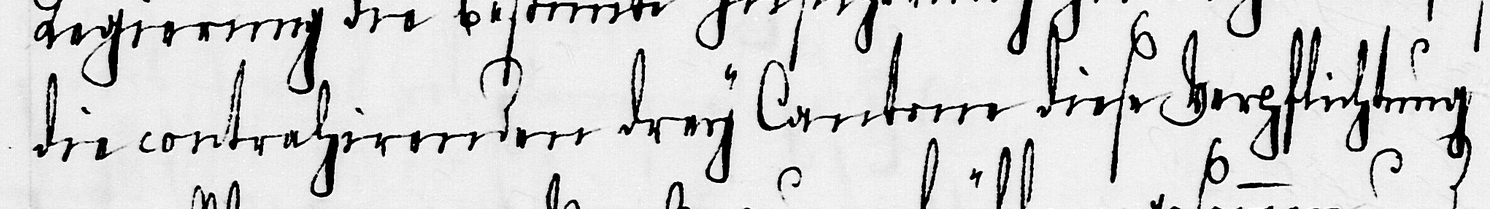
die contrahirenden drey Cantone diese Verpflichtung
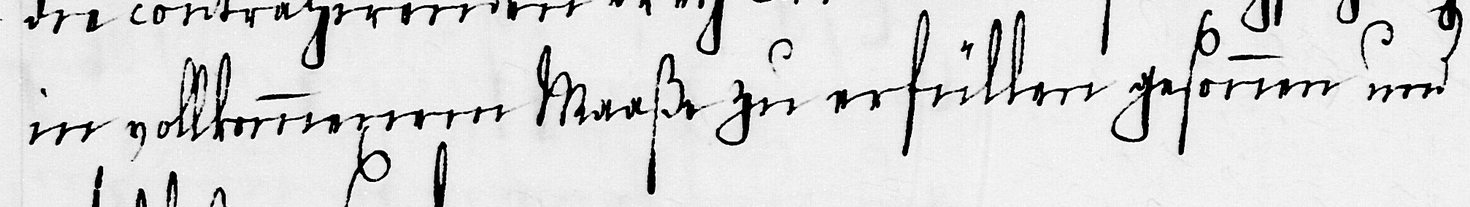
in vollkommenem Maaße zu erfüllen gesonnen und
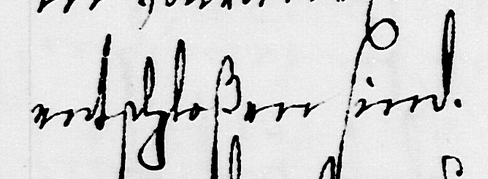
entschloßen sind.
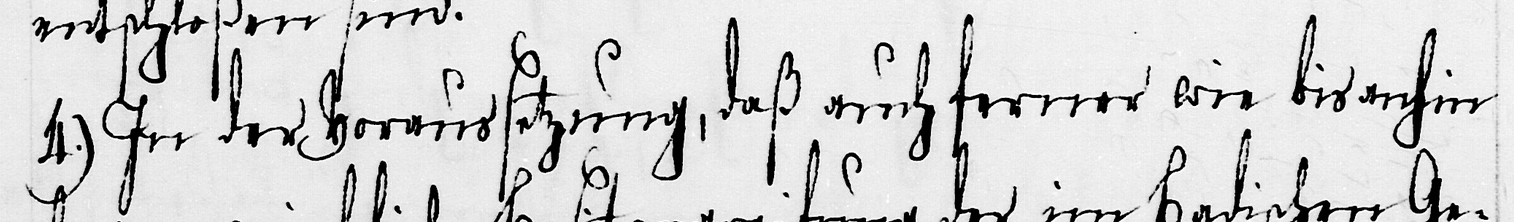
4.) In der Voraussetzung, daß auch ferner wie bis anhin
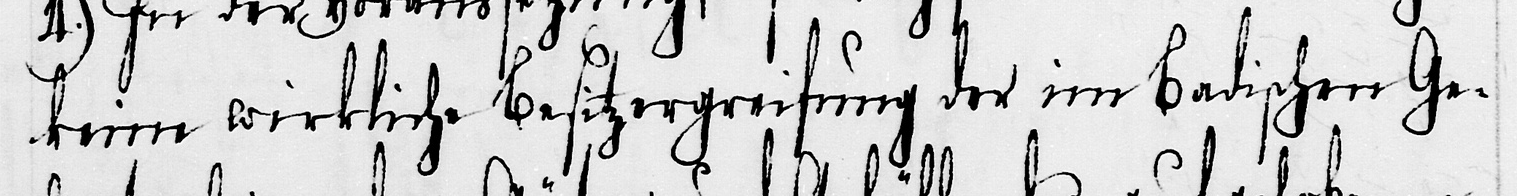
keine wirkliche Besitzergreifung der im Badischen Ge¬
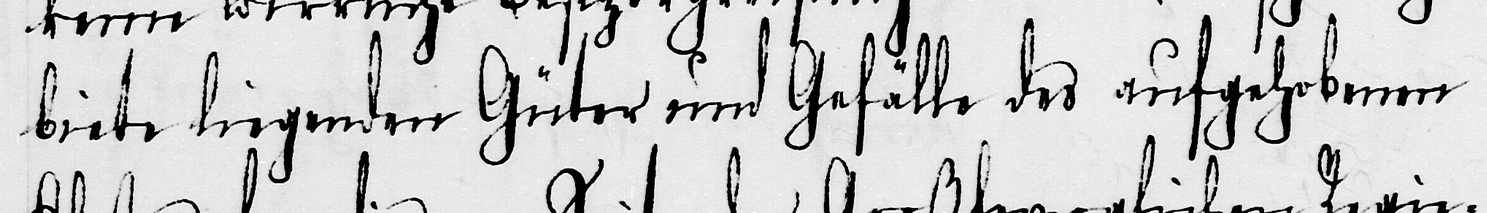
biete liegenden Güter und Gefälle des aufgehobenen
